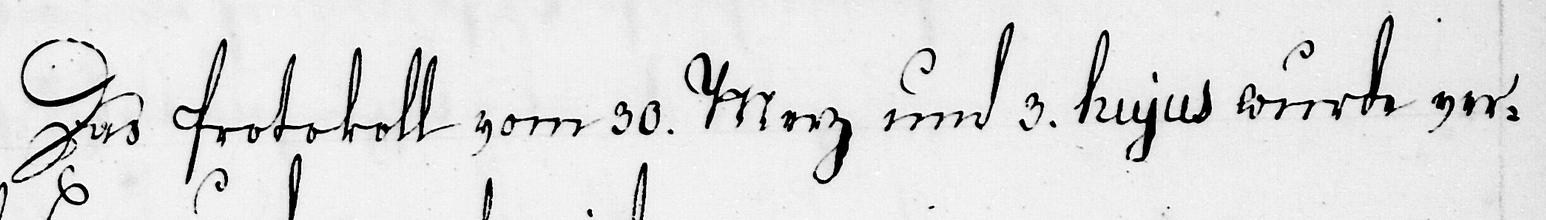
Das Protokoll vom 30. Merz und 3. hujus wurde ver¬
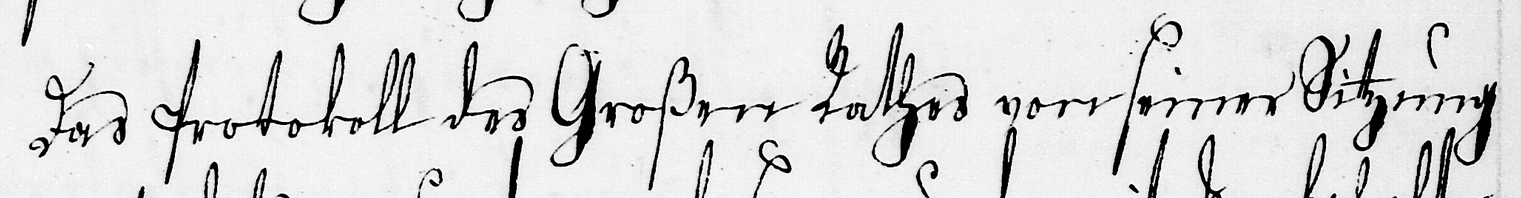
Das Protokoll des Großen Rathes von seiner Sitzung
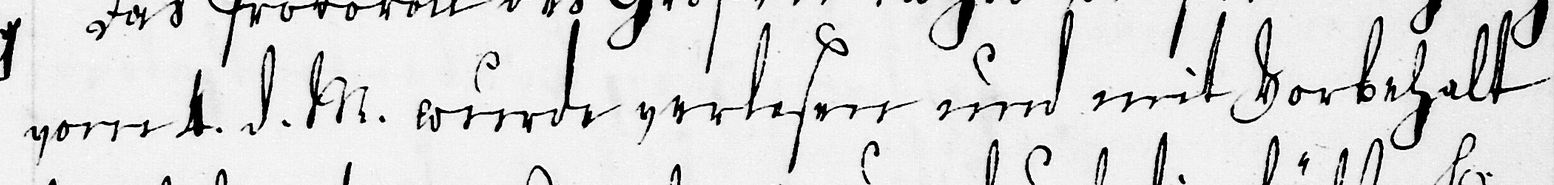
vom 4. d. M. wurde verlesen und mit Vorbehalt
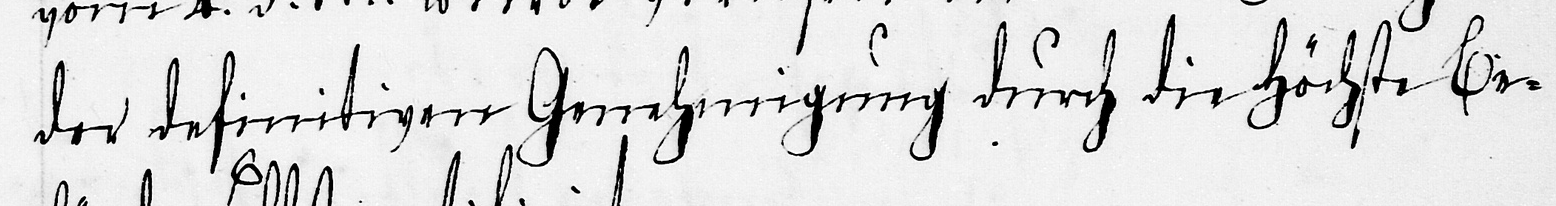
der definitiven Genehmigung durch die Höchste Be¬
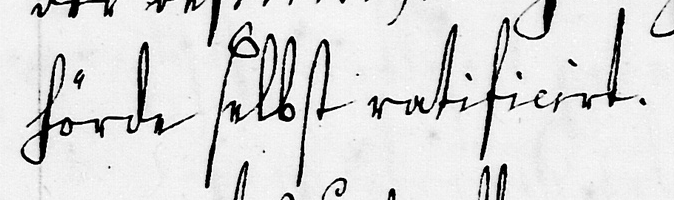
hörde selbst ratificirt.
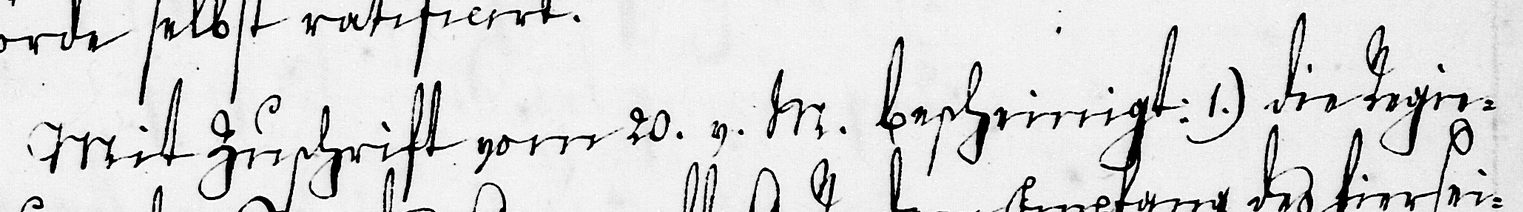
Mit Zuschrift vom 20. v. M. bescheinigt: 1.) die Regie¬
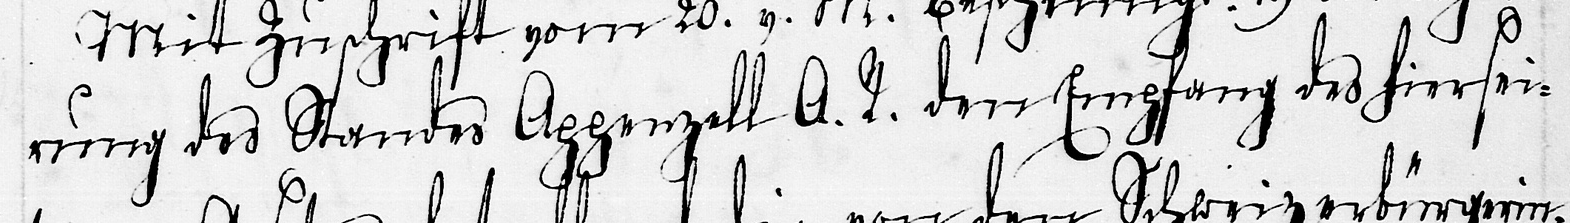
rung des Standes Appenzell A. R. den Empfang des hiersei¬
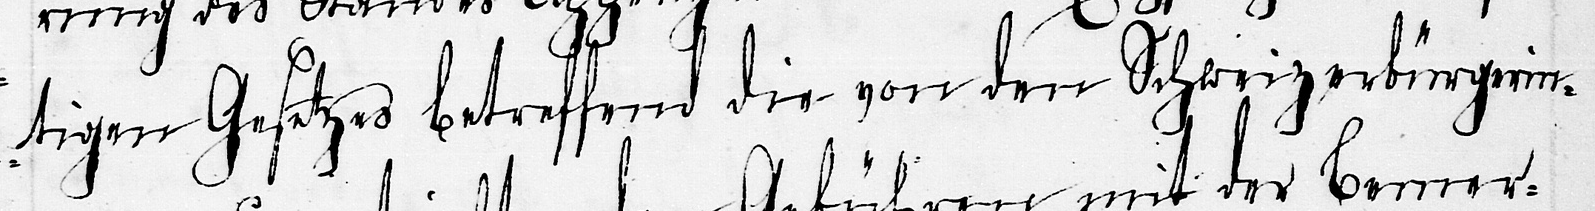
tigen Gesetzes betreffend die von den Schweizerbürgerin¬
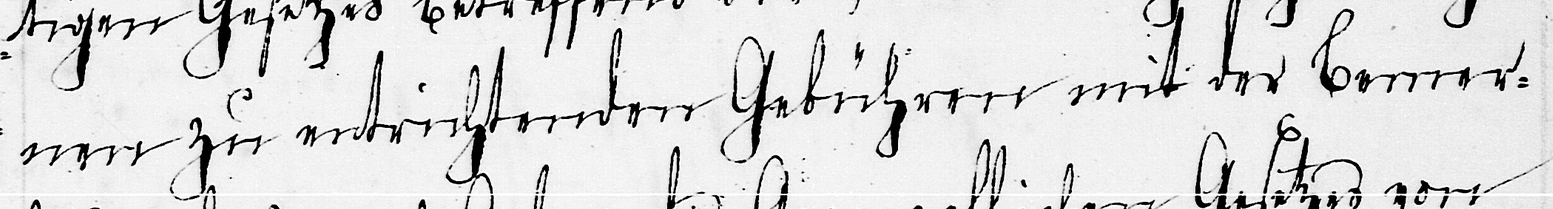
nen zu entrichtenden Gebühren mit der Bemer¬
